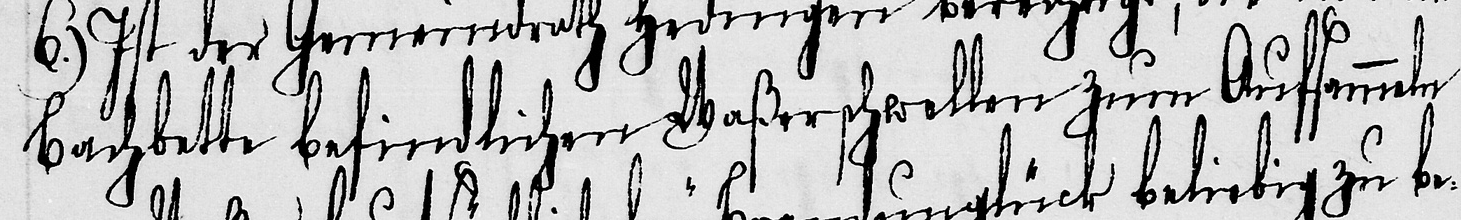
Bachbette befindlichen Waßerschwellen zum Aufsammeln
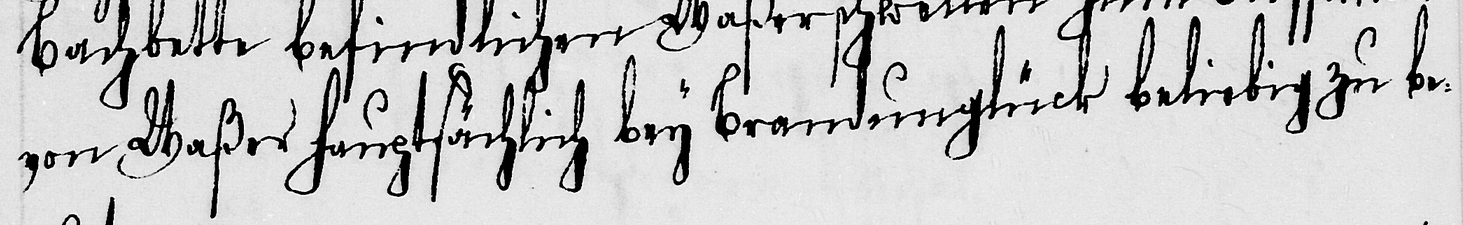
von Waßer hauptsächlich bey Brandunglück beliebig zu be¬
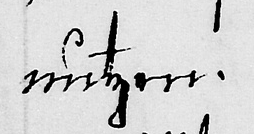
nutzen.
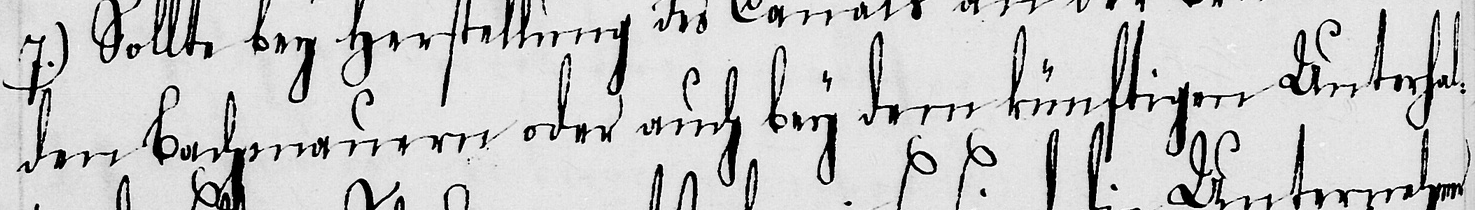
den Bachmauern oder auch bey dem künftigen Unterh¬
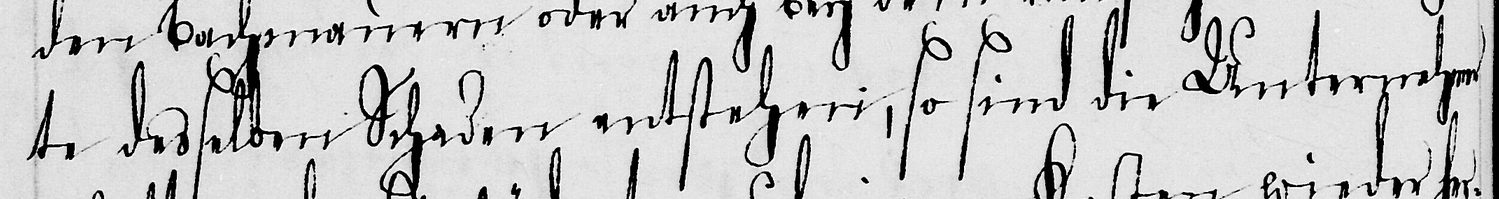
te desselben Schaden entstehen, so sind die Unterneh¬
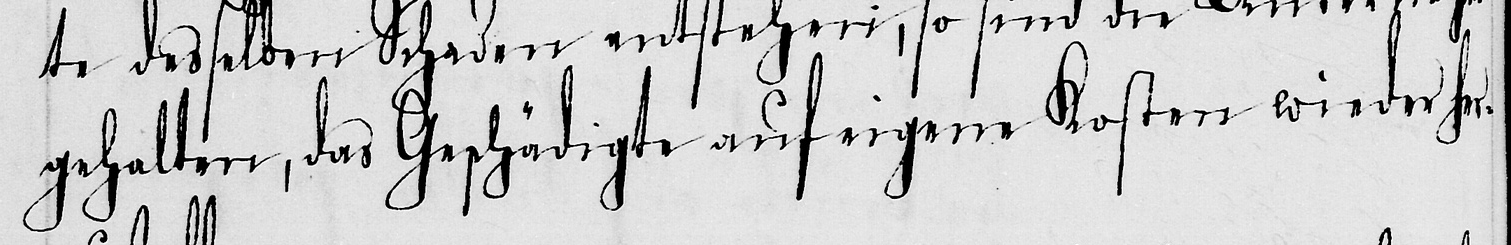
gehalten, das Geschädigte auf eigene Kosten wiederher¬
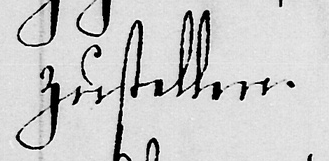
zustellen.
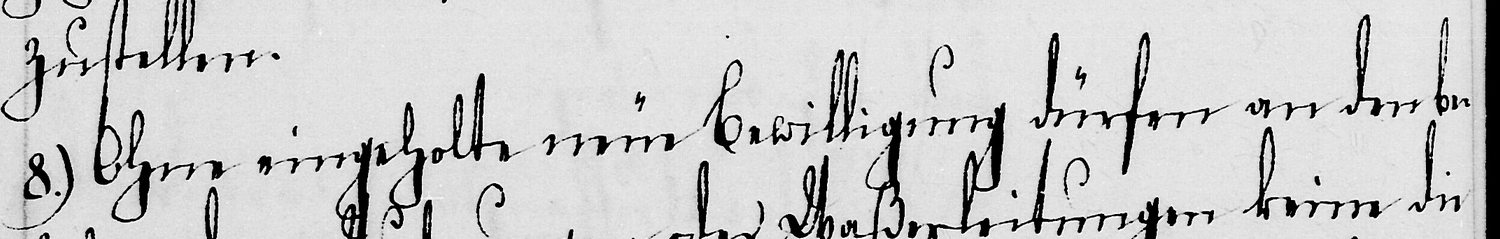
8.) Ohne eingeholte neue Bewilligung dürfen an den be¬
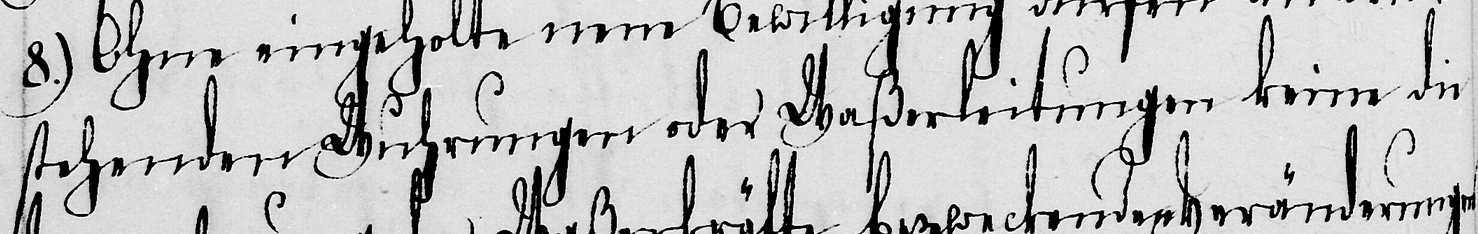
stehenden Wuhrungen oder Waßerleitungen keine die
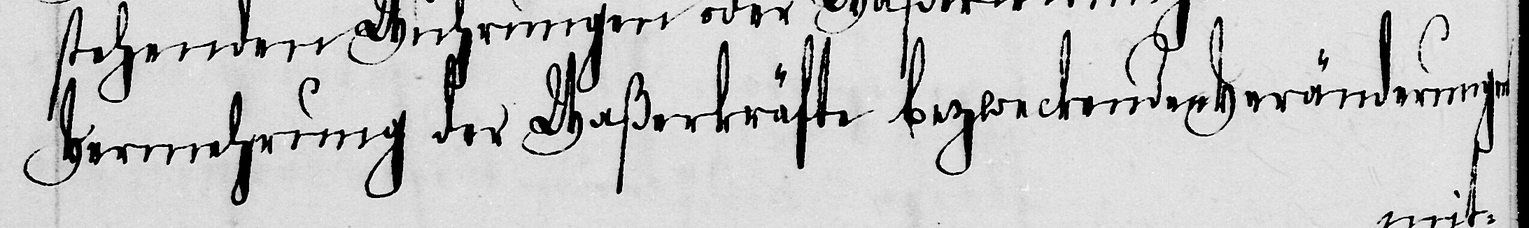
Vermehrung der Waßerkräfte bezweckende Veränderung¬
